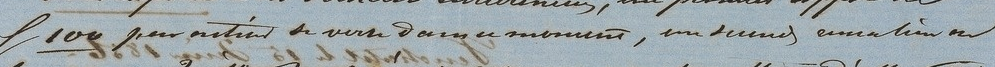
f 100 par action se verse dans ce moment, un second aura lieu de
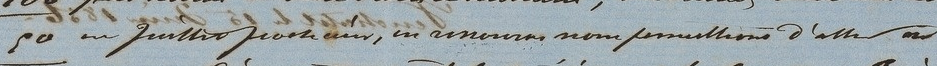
f 50 en Juillet prochain, ces ressources nous permettront d'aller de
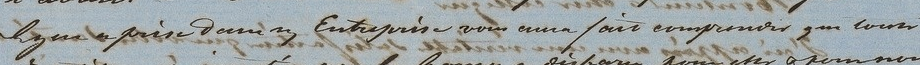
Lyon a prise dans notre Entreprise vous aura fait comprendre que toute
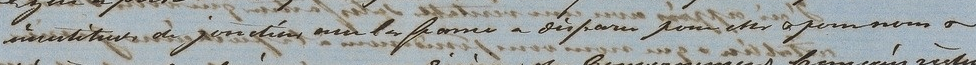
incertitude de jonction avec la France a disparu pour elle & pour nous &
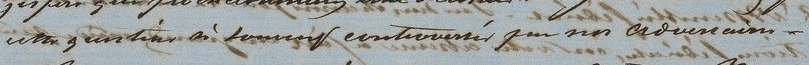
cette question si souvent controversée par nos Adversaires –
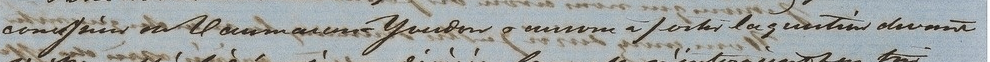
concession de Vaumarcus–Yverdon & aurons à porter la question devant
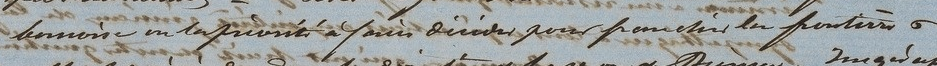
bernoise en la priorité à faire décider pour franchir la frontière &
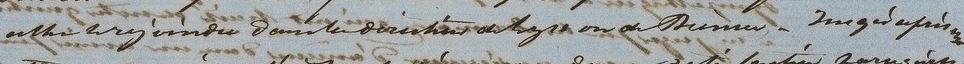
aller se rejoindre dans la direction de Lyss ou de Bienne – Jusqu'aprésent
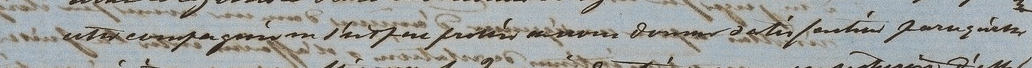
cette compagnie ne s'est pas pressée a nous donner satisfaction parce qu'elle
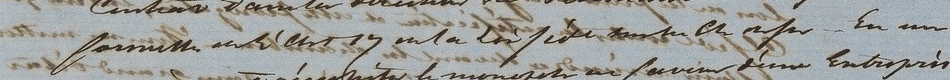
formelles de l'Art 17 de la Loi fédl sur les Ch de fer – En un
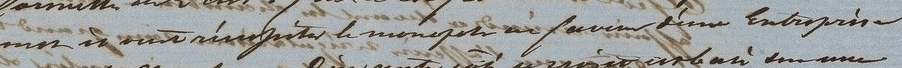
mot il veut résussiter le monopole en faveur d'une Entreprise
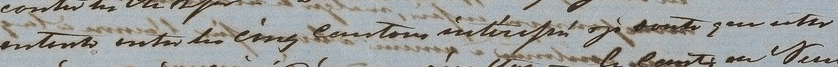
entente entre les cinq Cantons intéressés & je doute que cette
